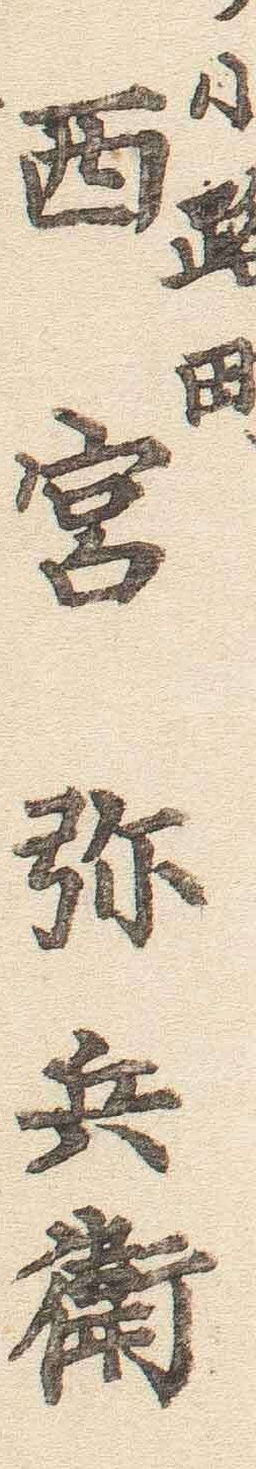西宮弥兵衛

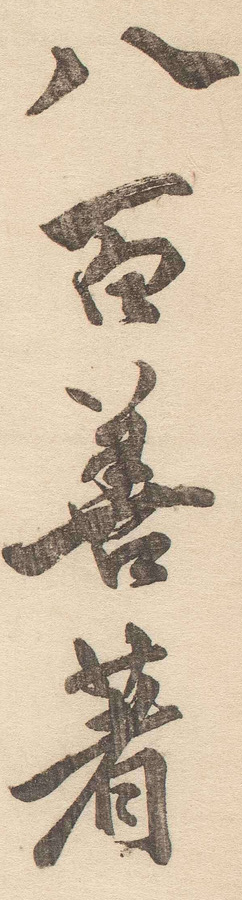八百善著
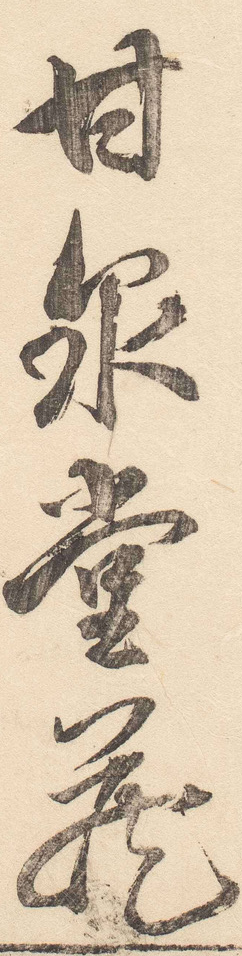甘泉堂蔵

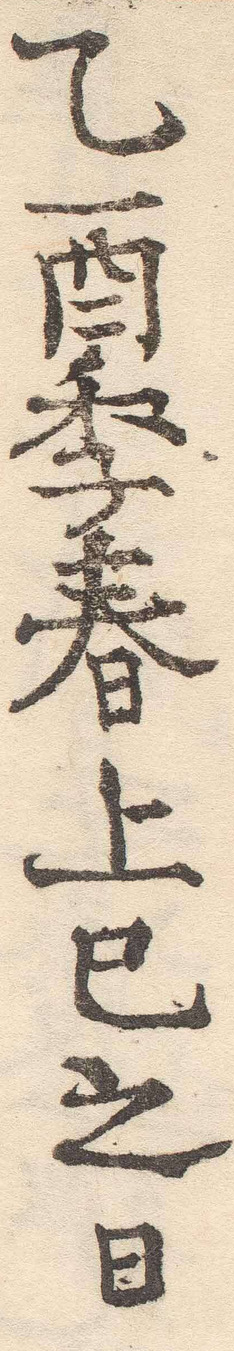乙酉季春上巳之日
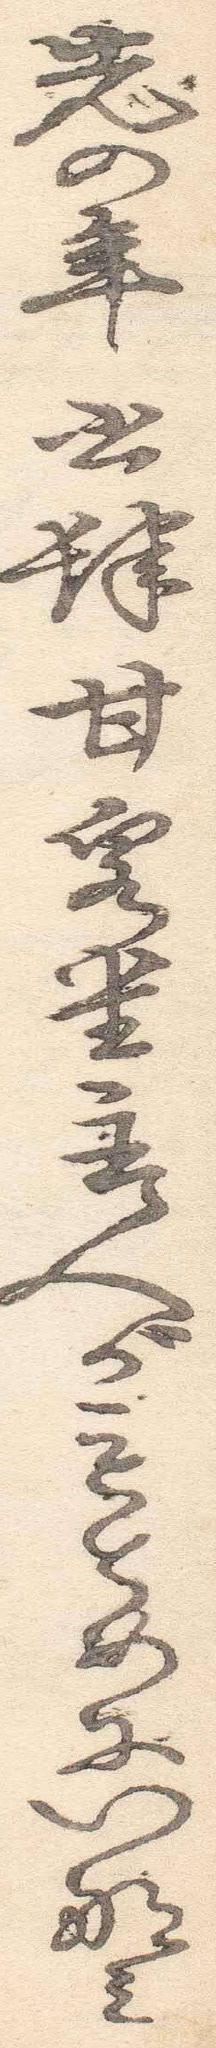先の年書肆甘泉堂主人ゟもとめにいなみ
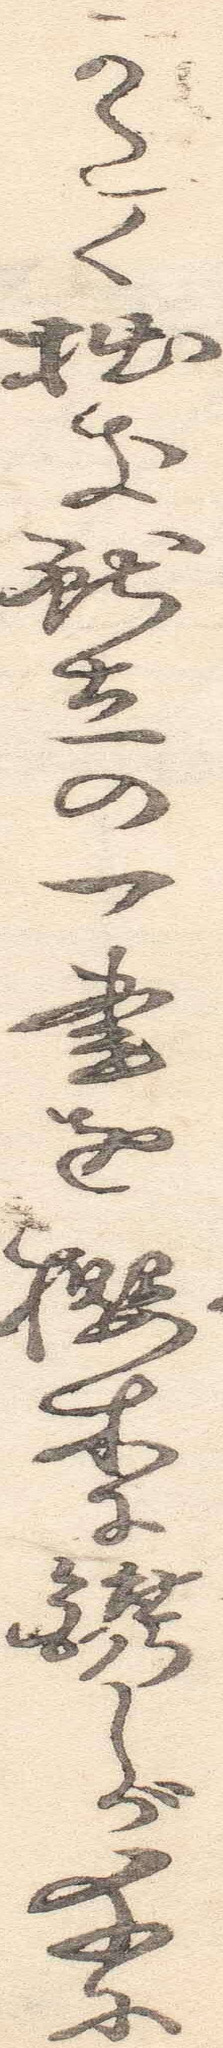かたく拙き献立の一書を桜木に鐫しが幸に
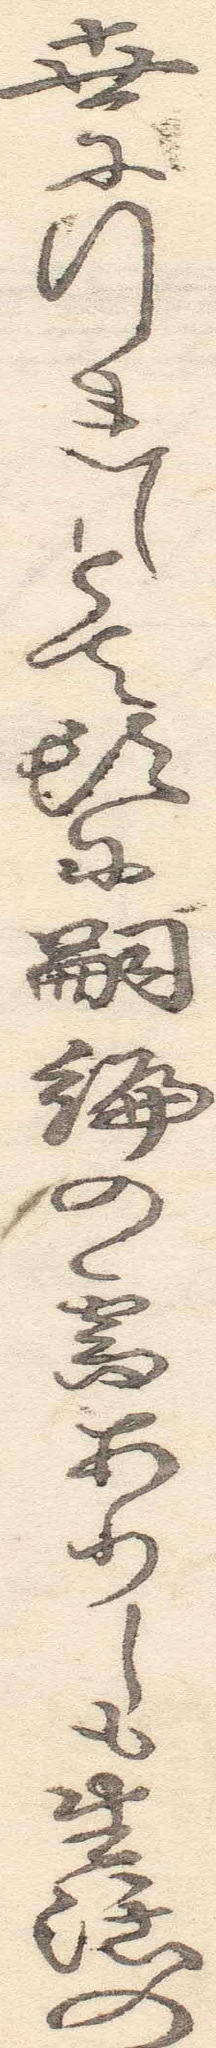世に行れしとて頓に嗣編の需ありしも生活の
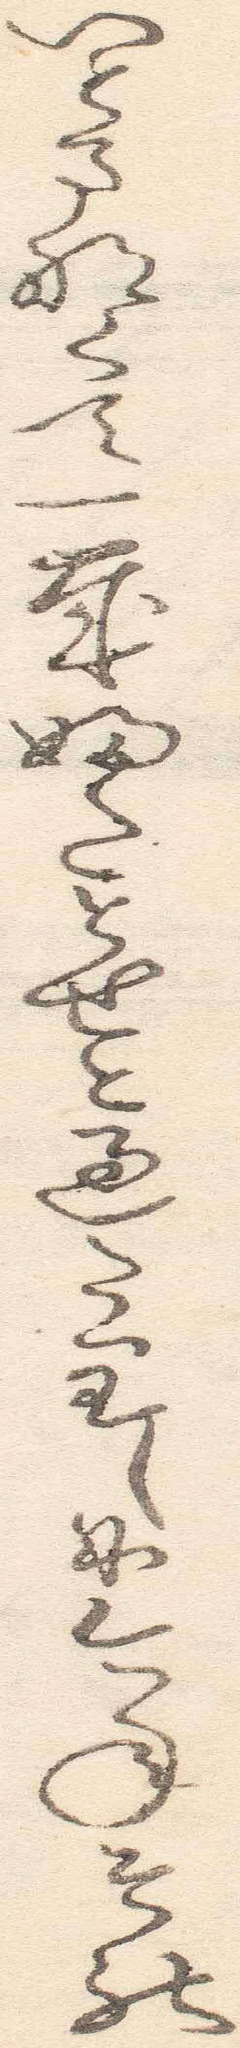いとまなくて一歳ふたとせと過たりしに今年その
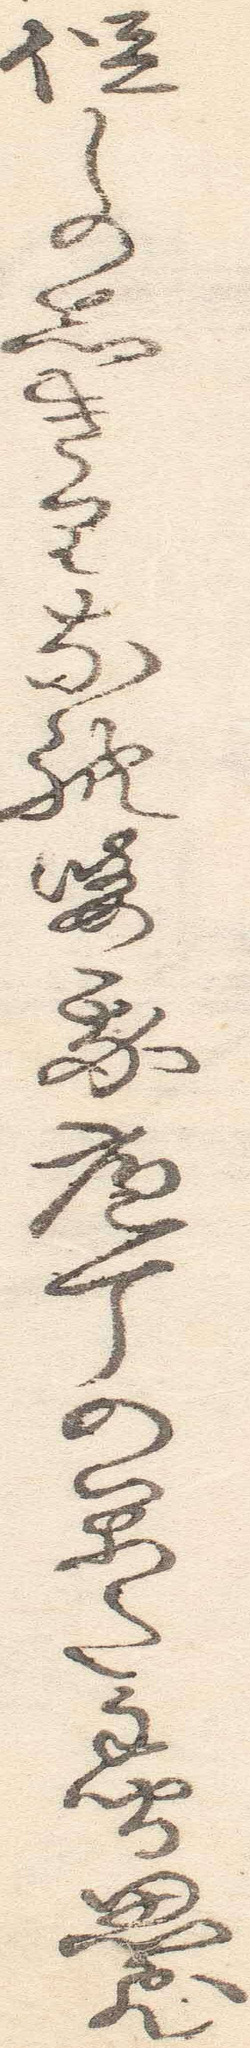促しのしきりなれは我庖丁のかたに聞思ひ
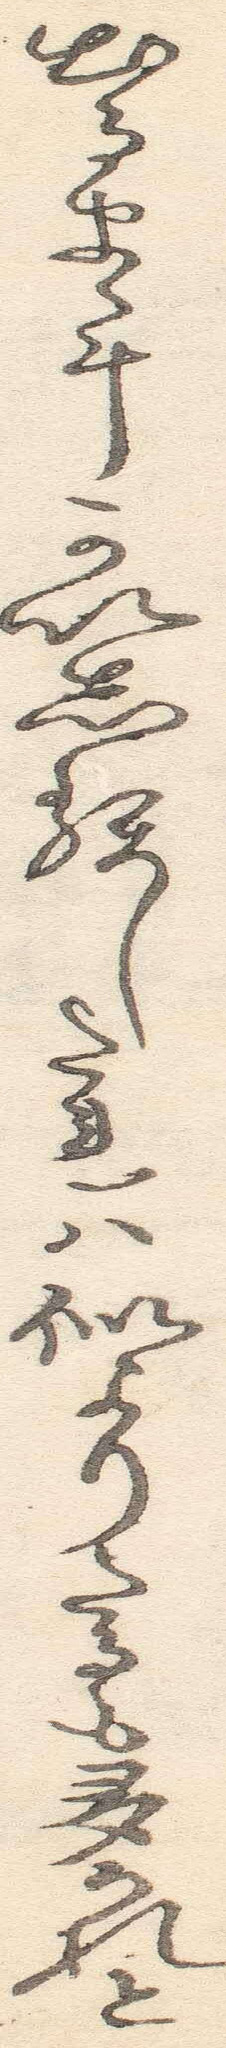出るまゝにかいしるしたれは似よりたるも多かれと
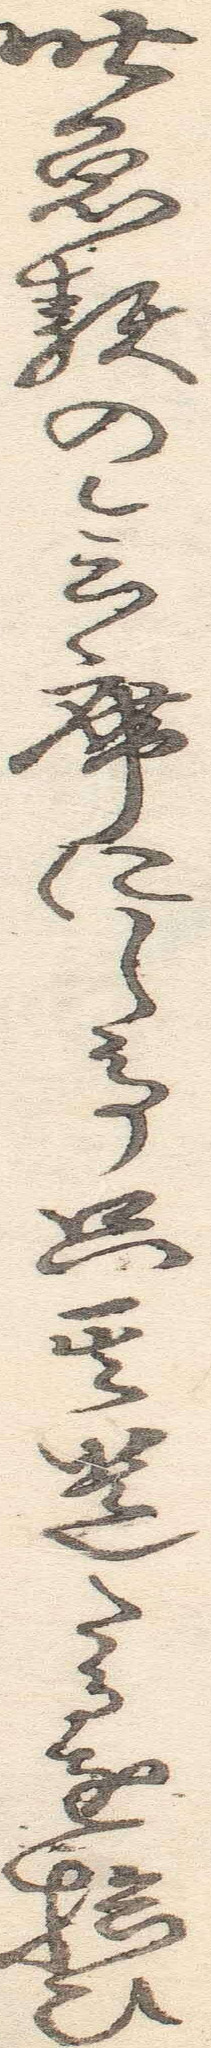昨魚類の会席にして只其遺たるを拾ひ
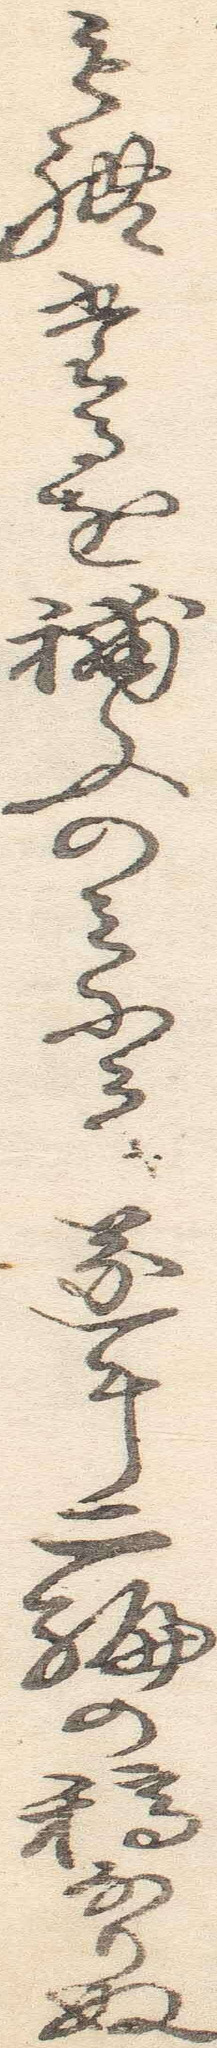もれたるを補ふのみにて遂に二編の稿なりぬ
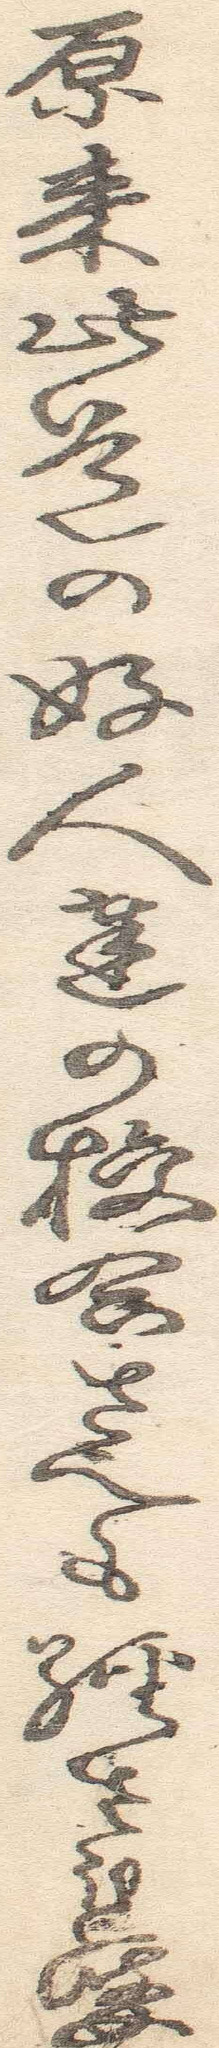原来此道の好人達の校合さへも経されは
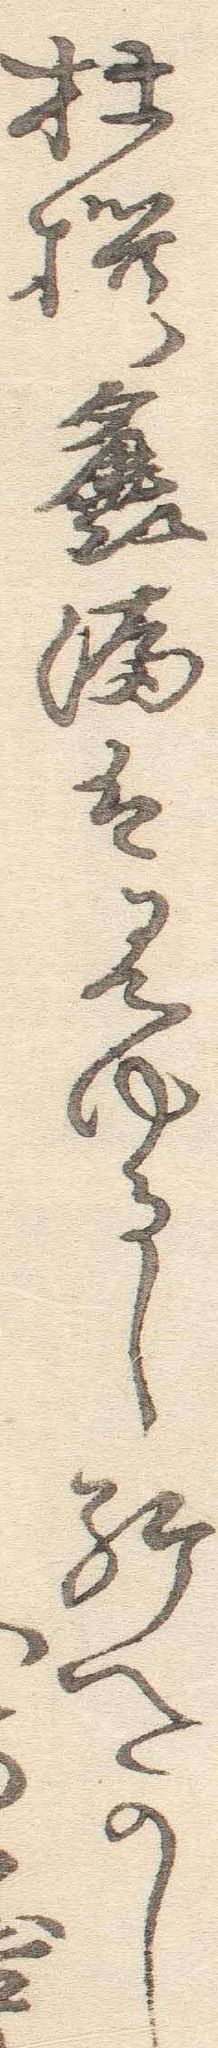杜撰麁漏は見ゆるし給へかし
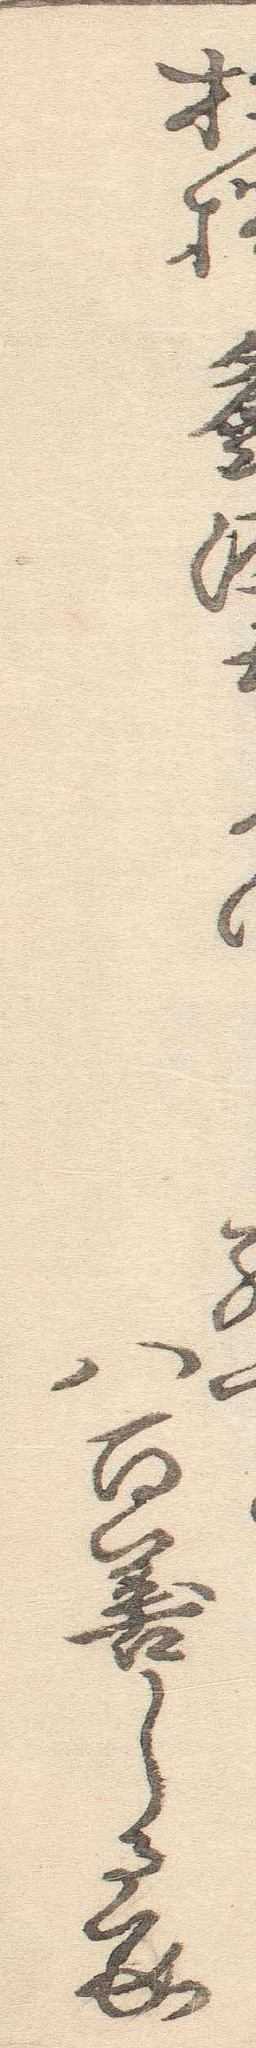八百善しるす
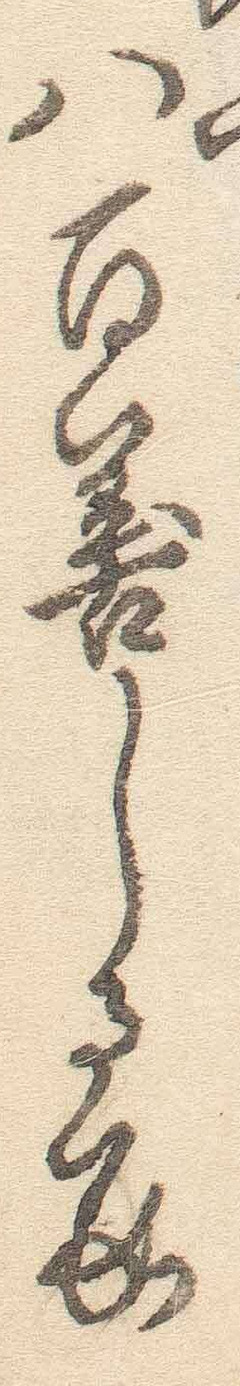八百善しるす
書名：料理通
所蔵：東京学芸大学附属図書館 国文学研究資料館
